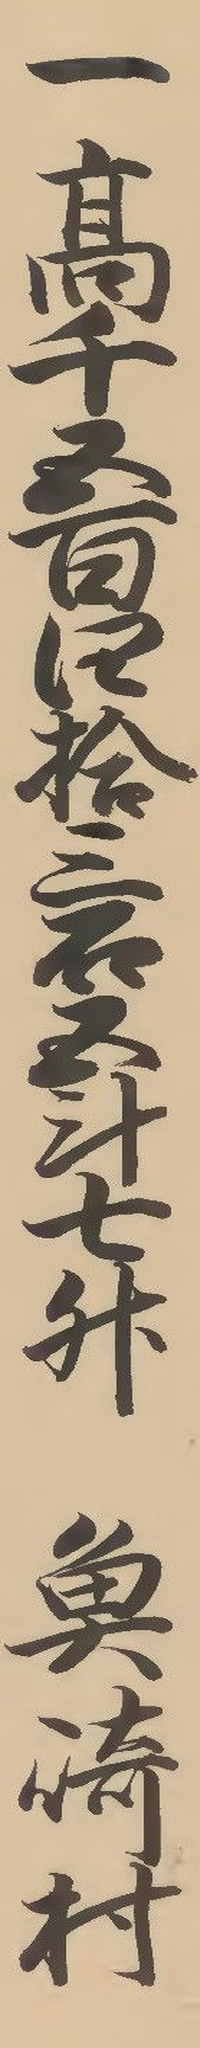一髙千五百四拾三石五斗七升魚崎村
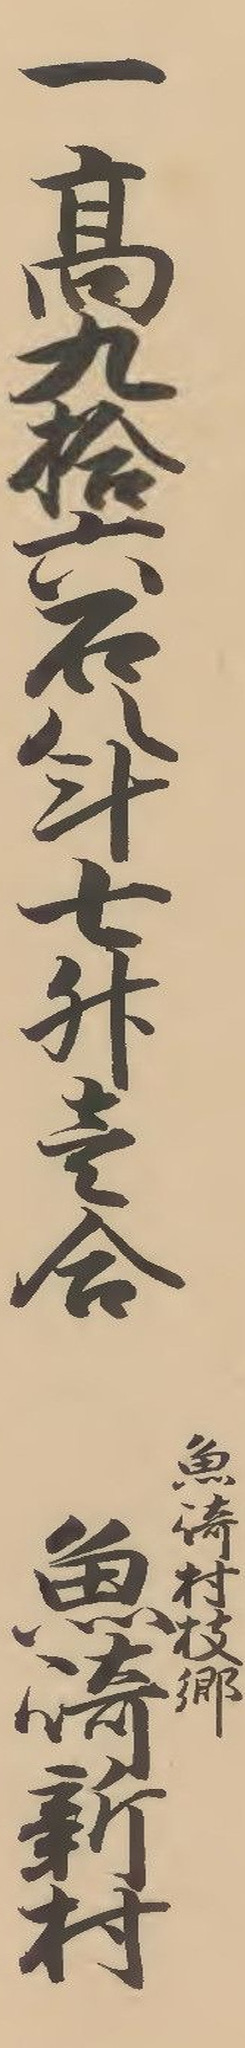一髙九拾六石八斗七升弐合魚崎新村
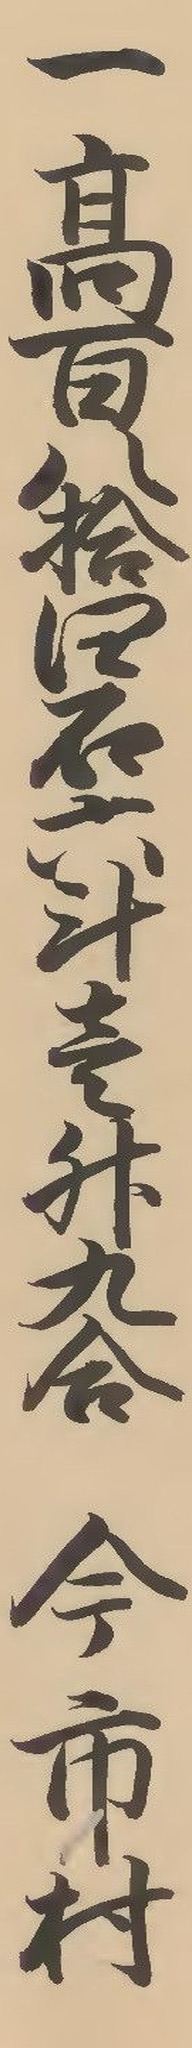一髙百八拾四石六斗壱升九合今市村

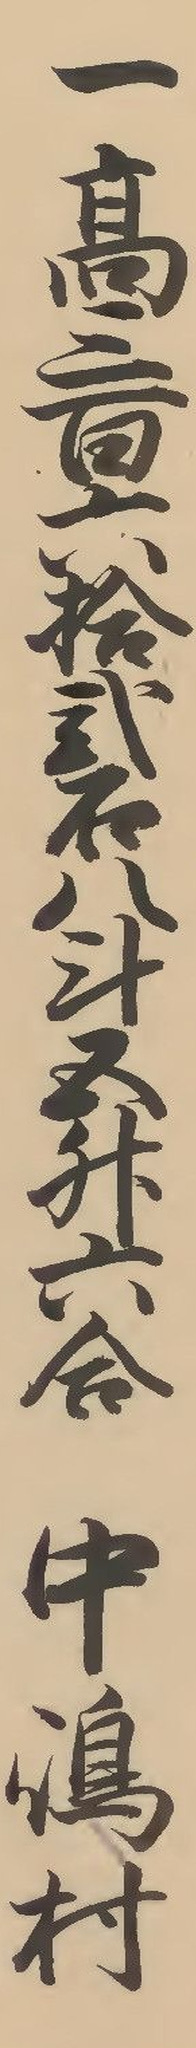一髙三百六拾弐石八斗五升六合中嶋村
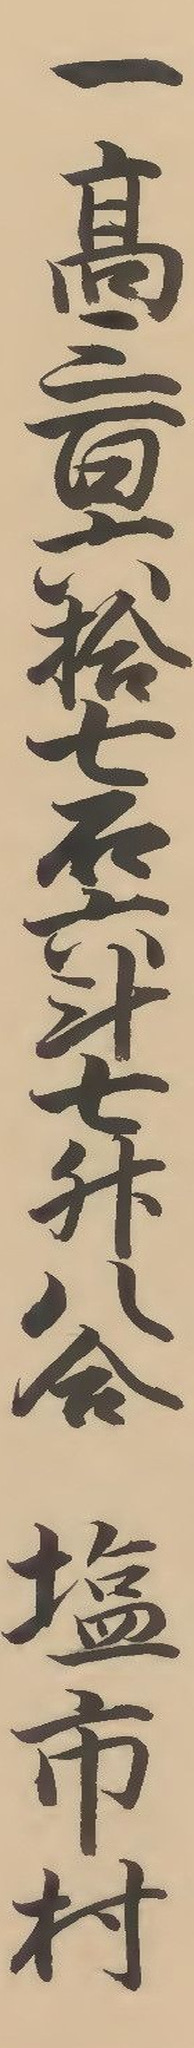一髙三百六拾七石六斗七升八合塩市村
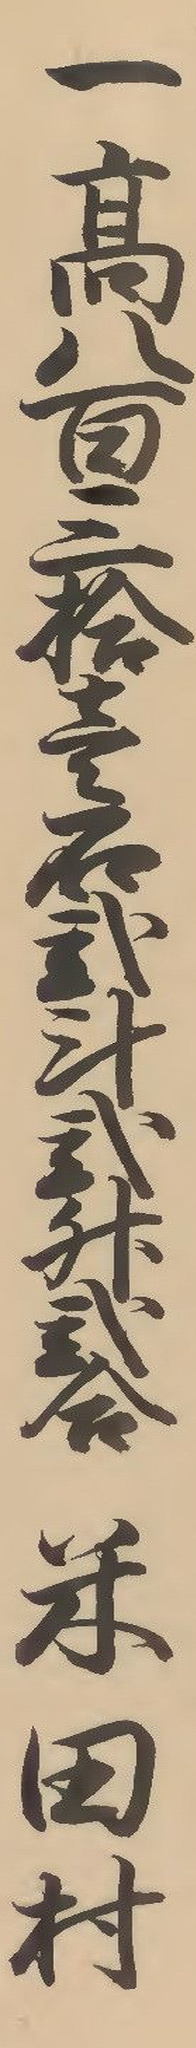一髙八百三拾壱石弐斗弐升弐合米田村
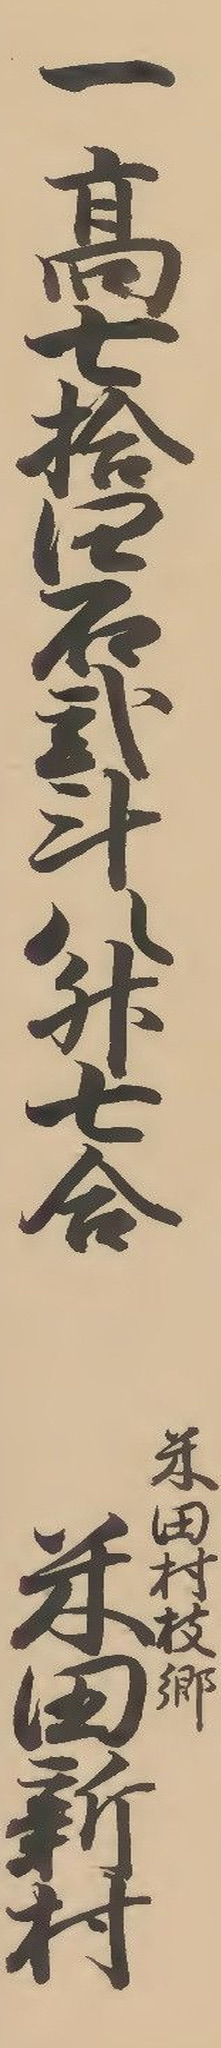一髙七拾四石弐斗八升七合米田新村
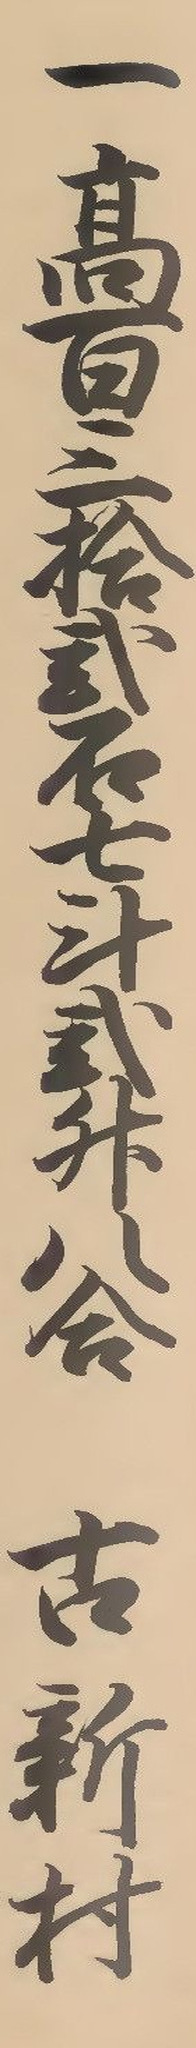一髙百三拾弐石七斗弐升八合古新村
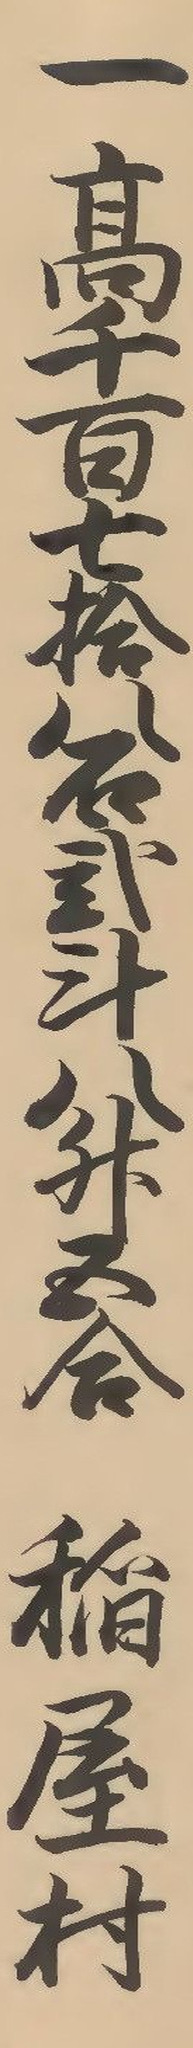一髙千百七拾八石弐斗八升五合稲屋村
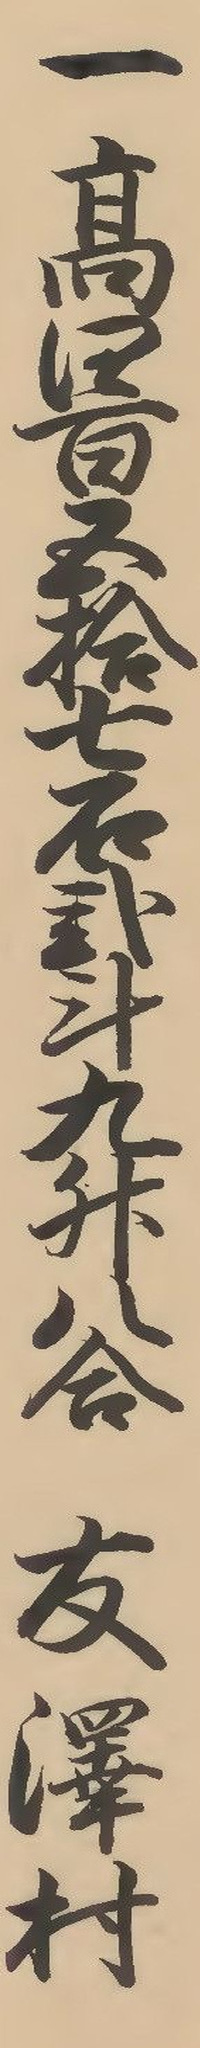一髙四百五拾七石弐斗九升八合友澤村
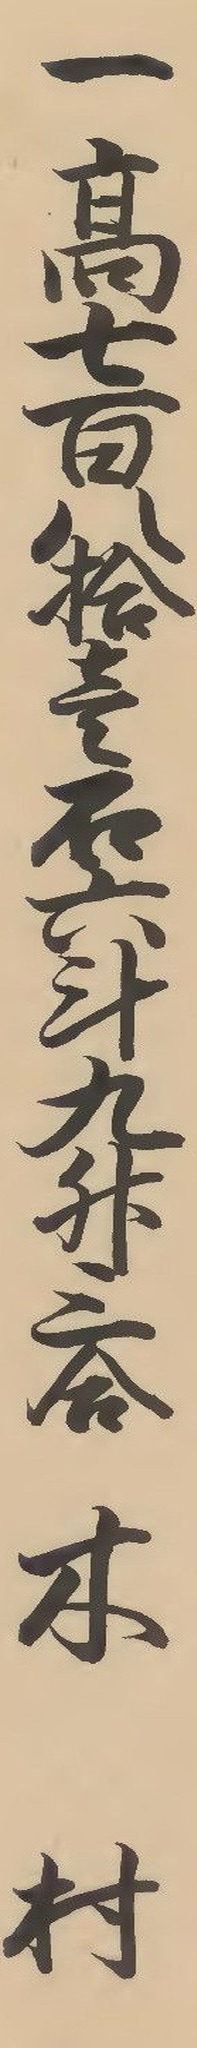一髙七百八拾壱石六斗九升三合木村

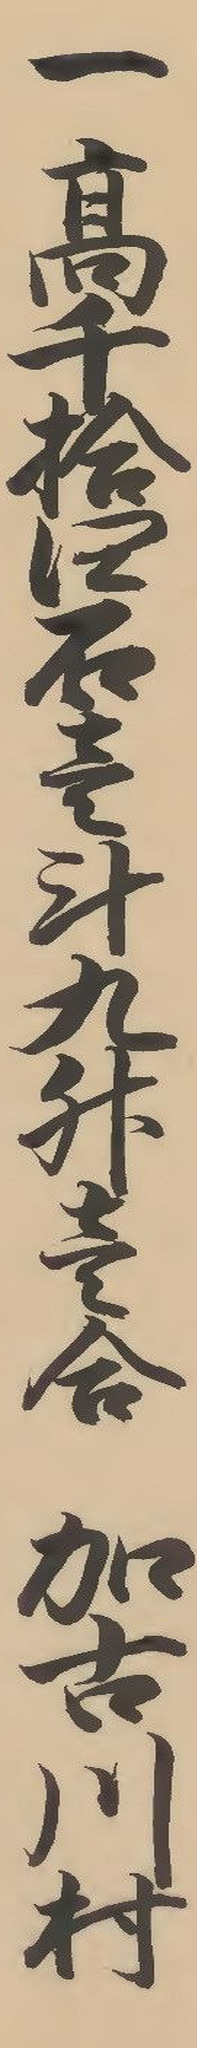一髙千拾四石壱斗九升壱合加古川村
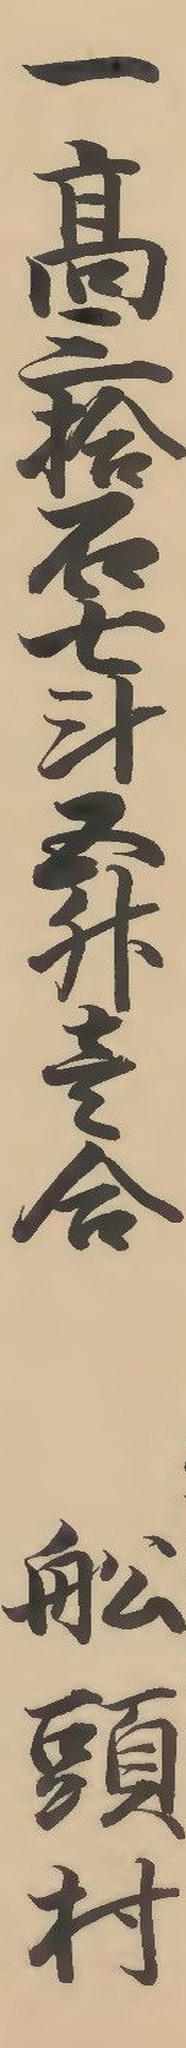一髙三拾石七斗五升壱合舩頭村
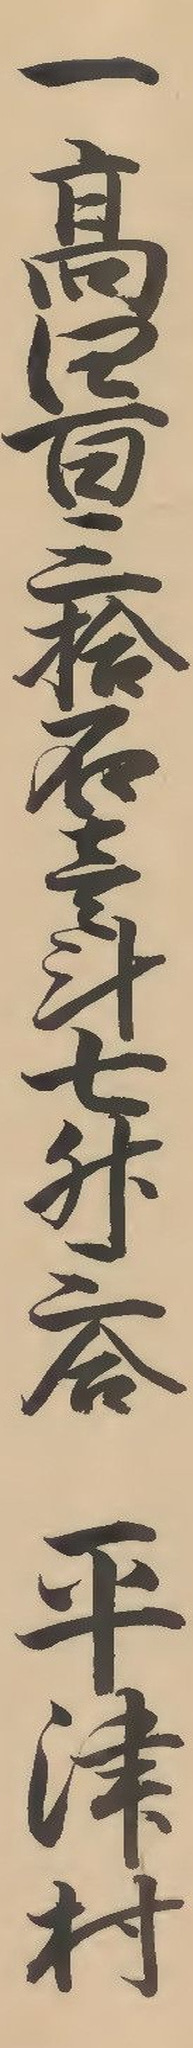一髙四百三拾石壱斗七升三合平津村
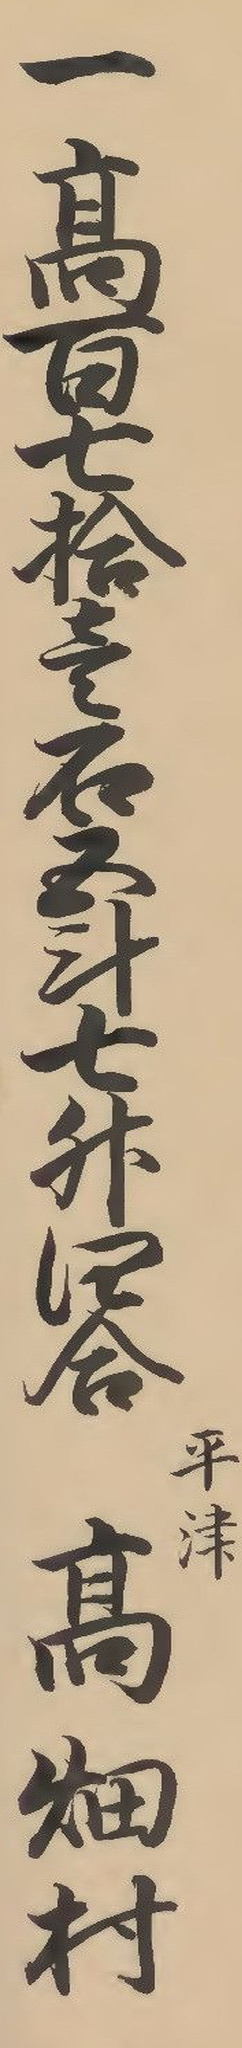一髙百七拾壱石五斗七升四合髙畑村
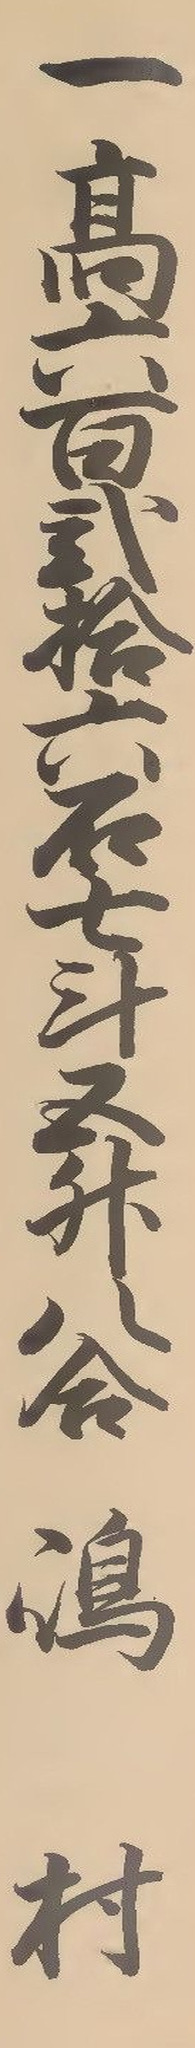一髙六百弐拾六石七斗五升八合嶋村
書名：播磨国郷帳
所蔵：国立公文書館 National Archives of Japan
